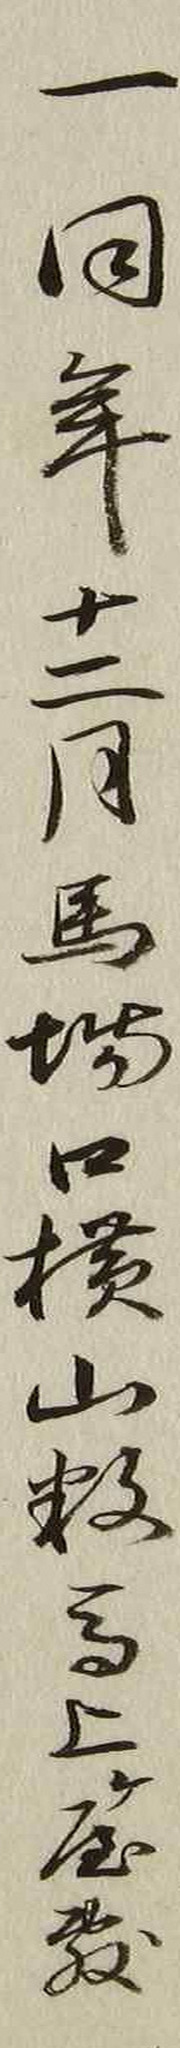一同年十二月馬場口横山数馬上ケ屋敷
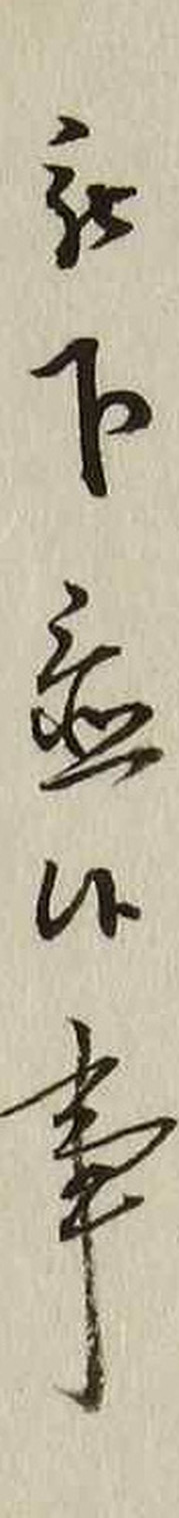被下置候事
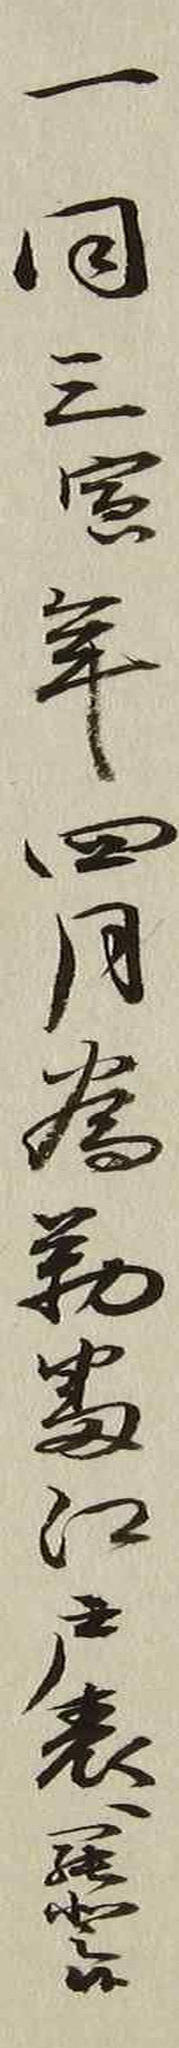一同三寅年四月為勤番江戸表へ罷登候
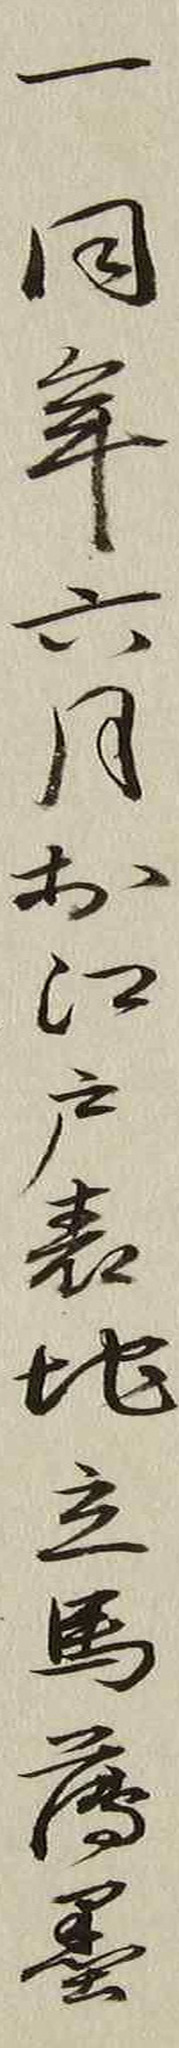一同年六月於江戸表地立馬薄墨
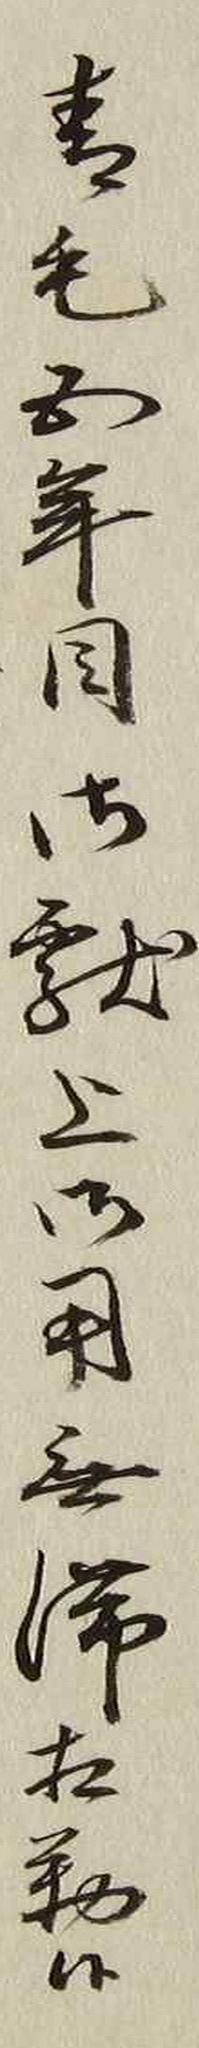青毛五年目御献上御用無滞相勤候
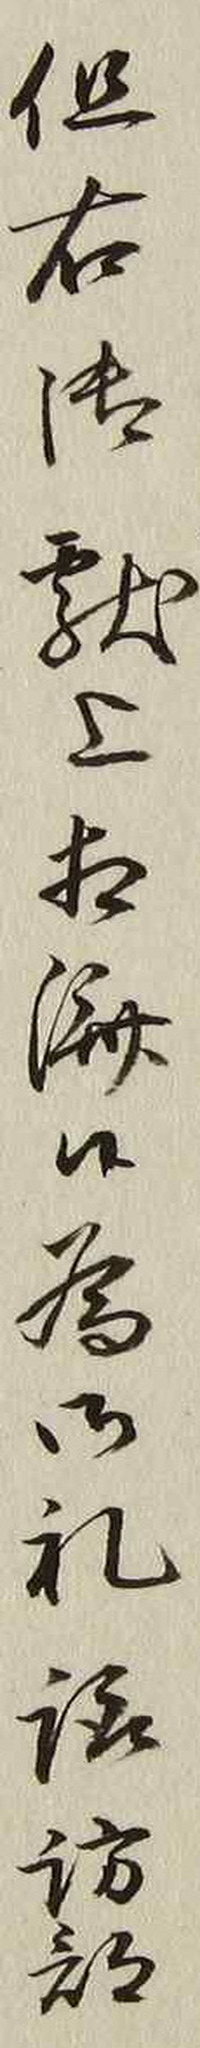但右御献上相済候為御礼諏訪部
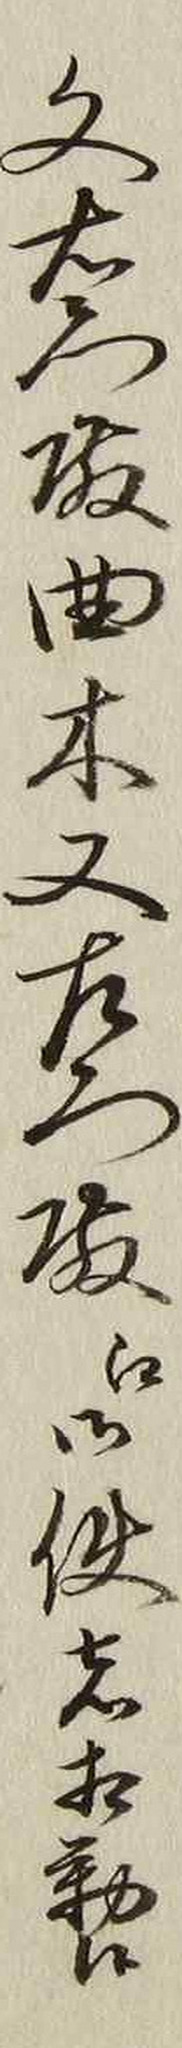久右衛門殿曲木又左衛門殿え御使者相勤候
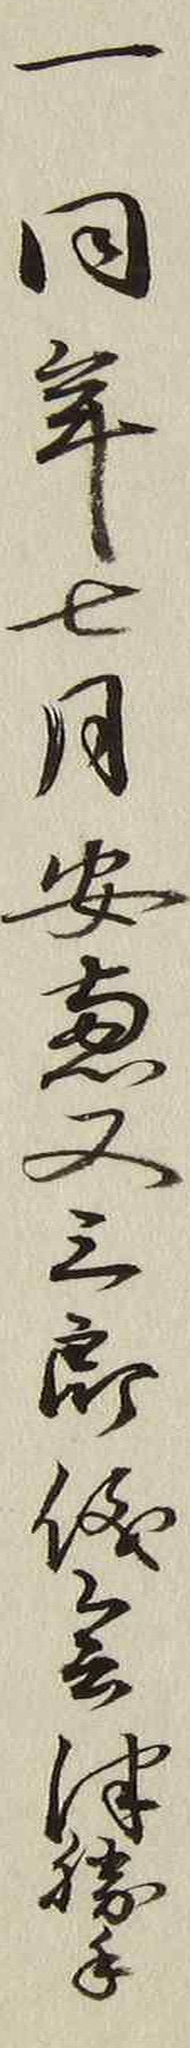一同年七月安恵又三郎儀会津勝手
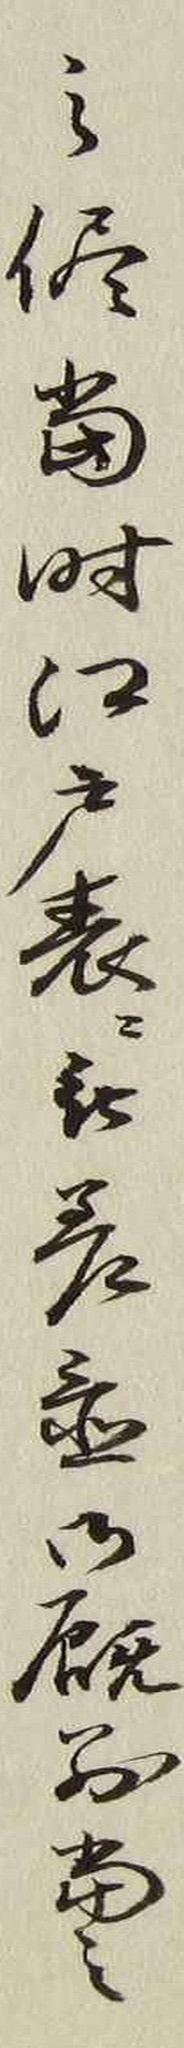之儘当時江戸表ニ被差置御厩別当之
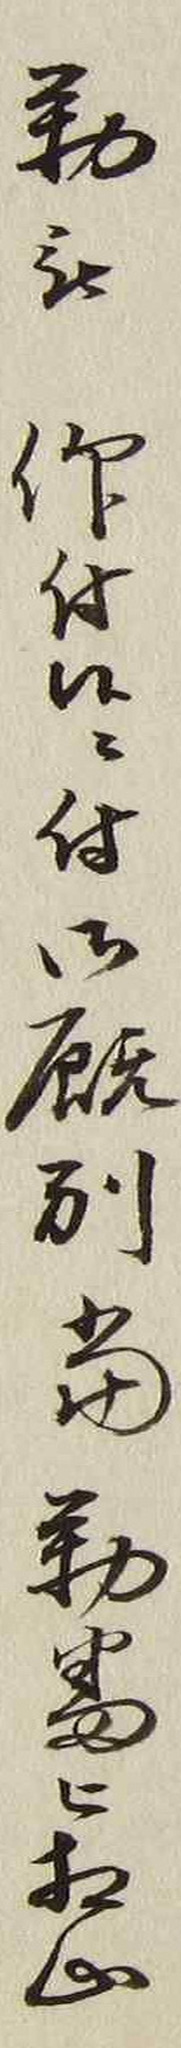勤被仰付候ニ付御厩別当勤番被相止
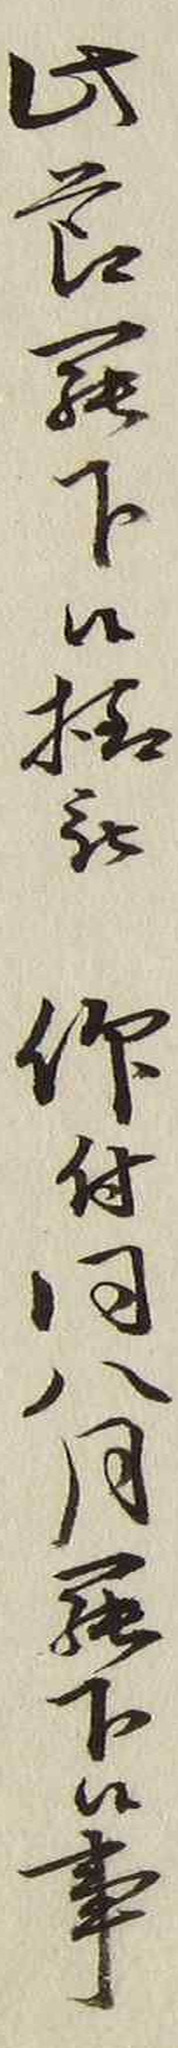此節罷下候様被仰付同八月罷下候事

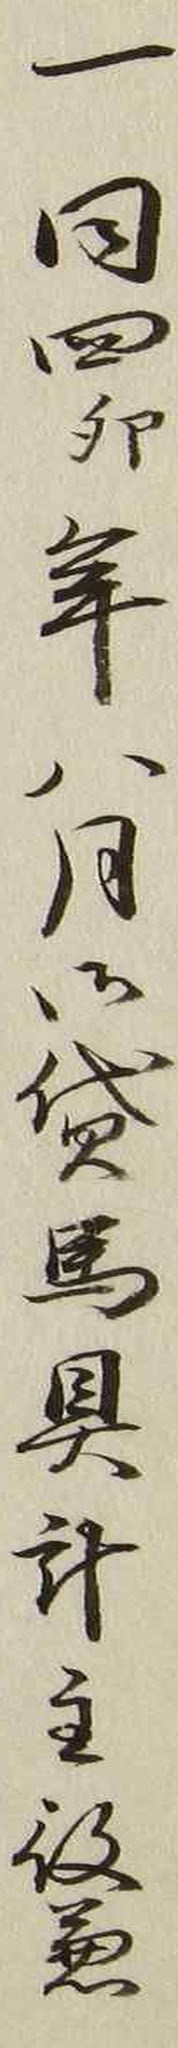一同四卯年八月御貸馬具計主役兼
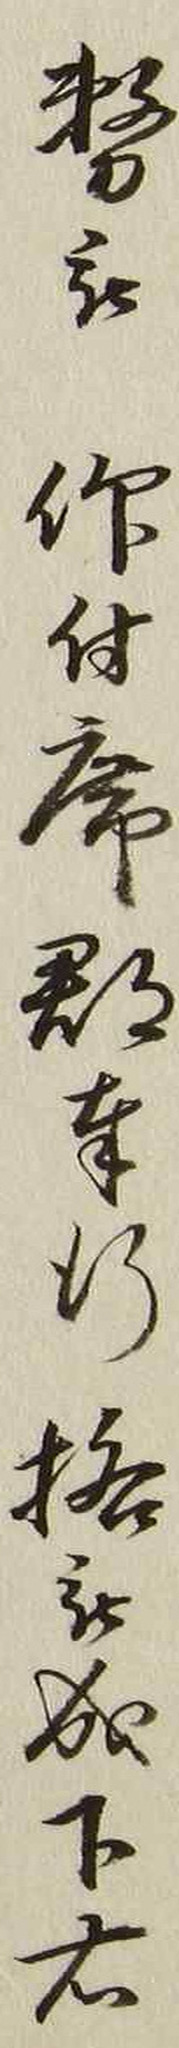務被仰付席郡奉行格被成下右
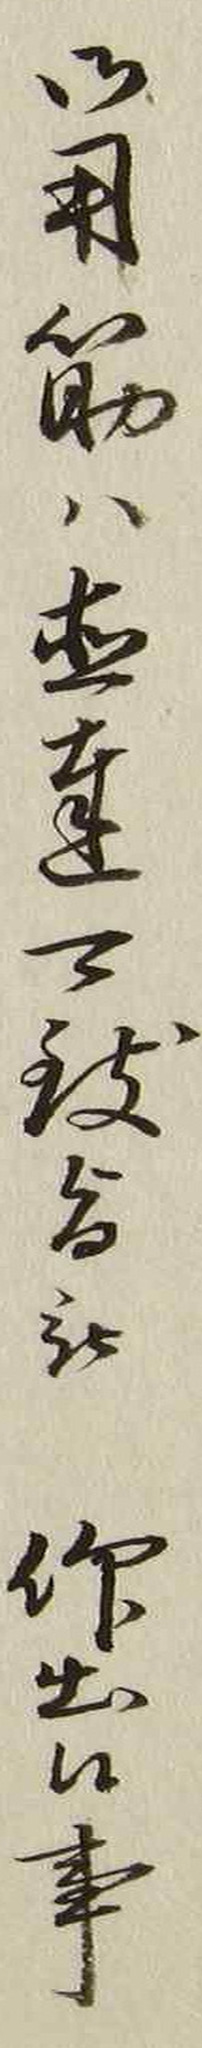御用筋ハ直達可致旨被仰出候事
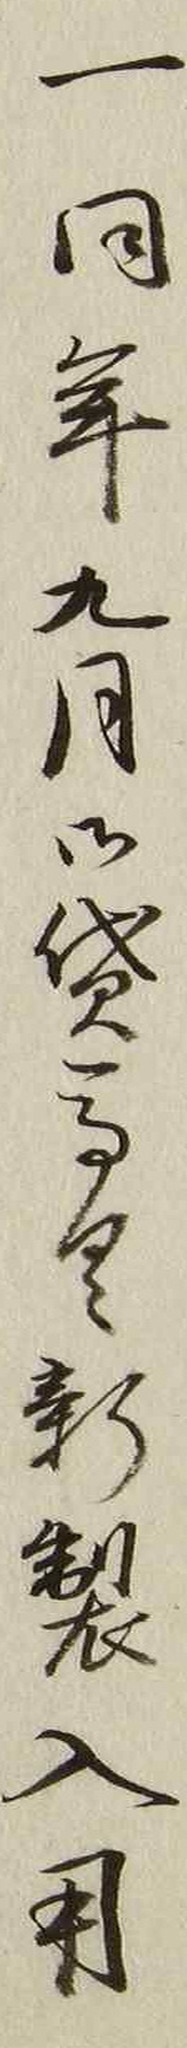一同年九月御貸馬具新製入用
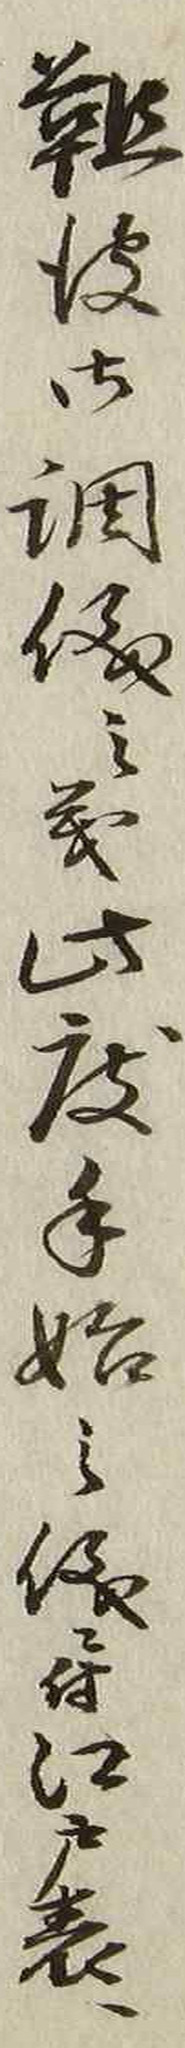靼波御調儀之義此度手始之儀ニ付江戸表へ
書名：諸士系譜　巻之160　な之部2
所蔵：会津若松市立会津図書館
